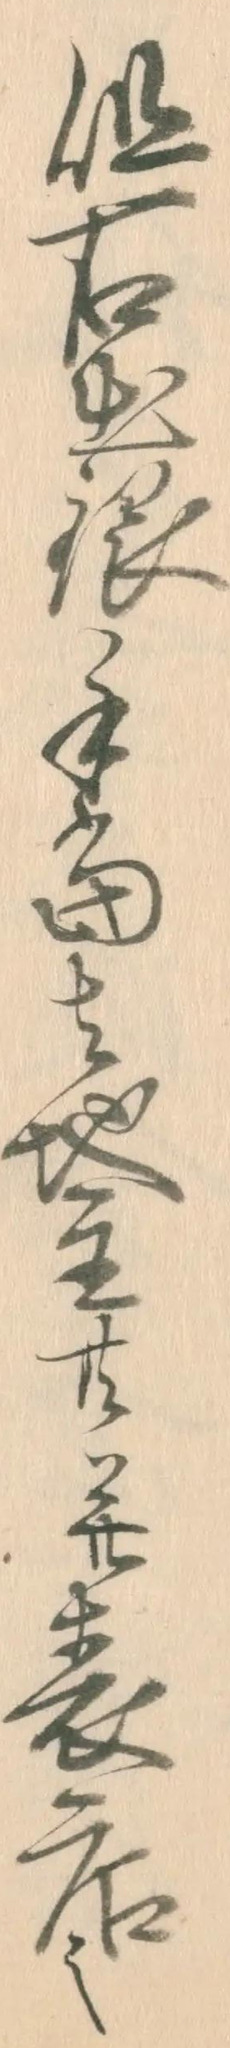但右出銀手当は地主共并表店之
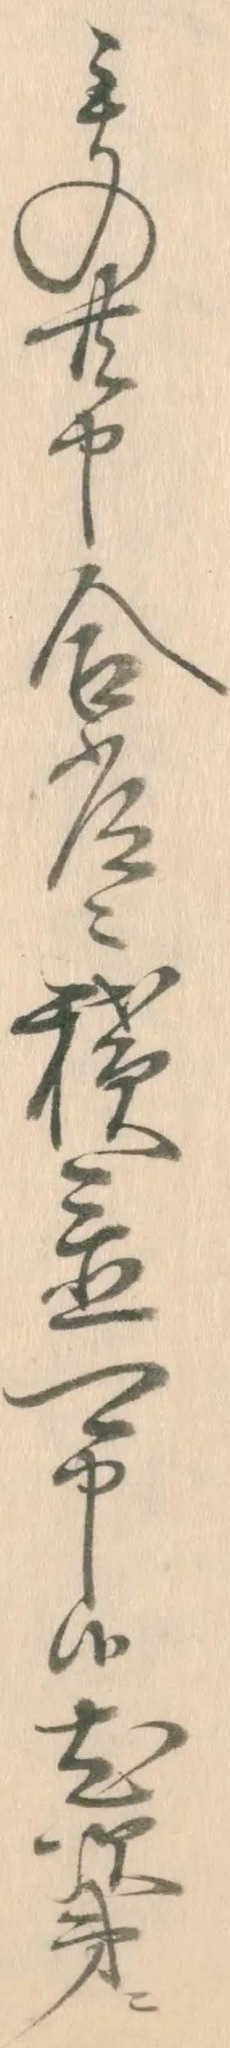もの共申合常々積置可申候尤次第ニ
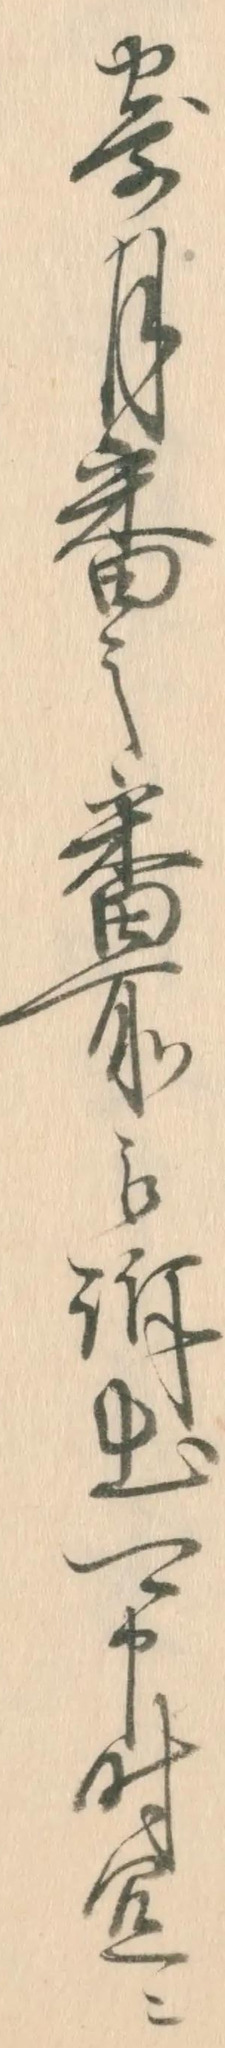寄月番之番所え訴出可申時宜ニ
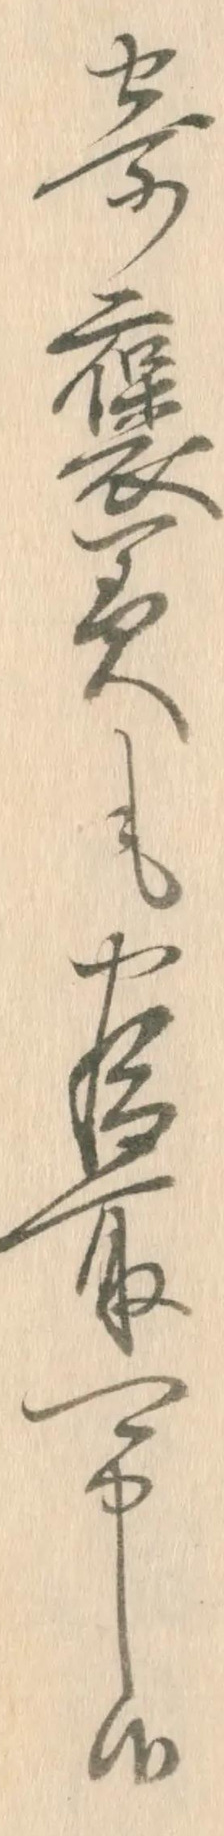寄褒美も為取可申候
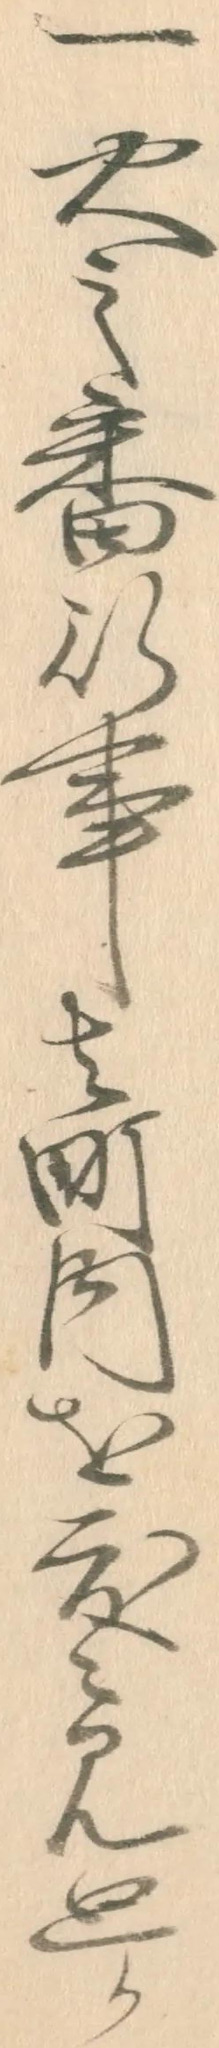一火之番行事は町内を度々見廻り

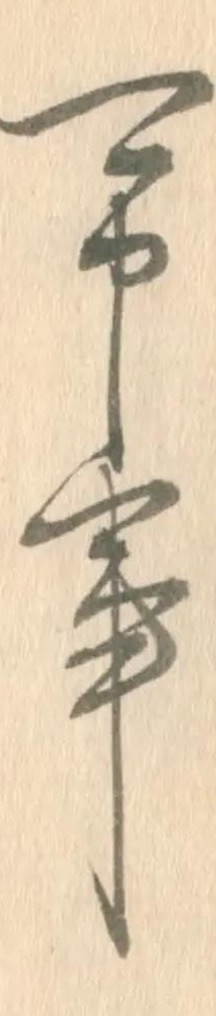可申事
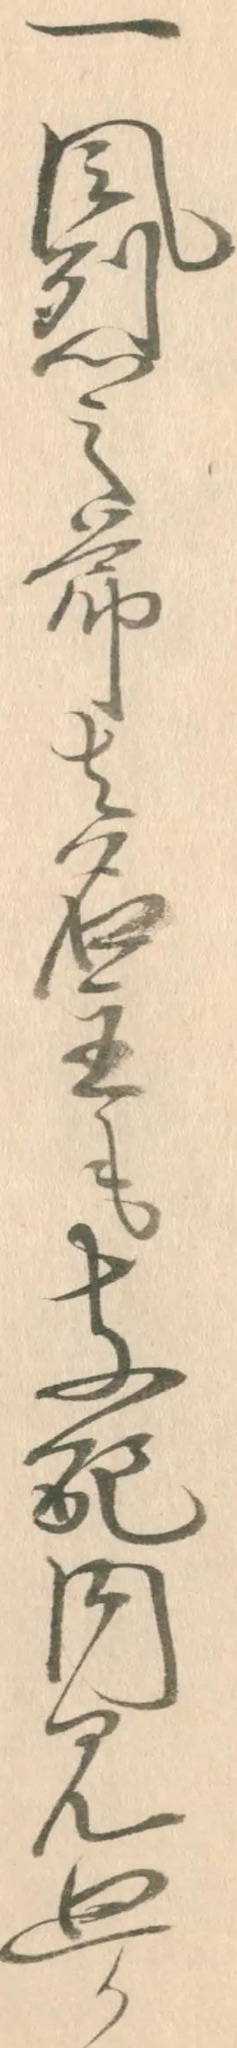一風烈之節は名主も支配内見廻り
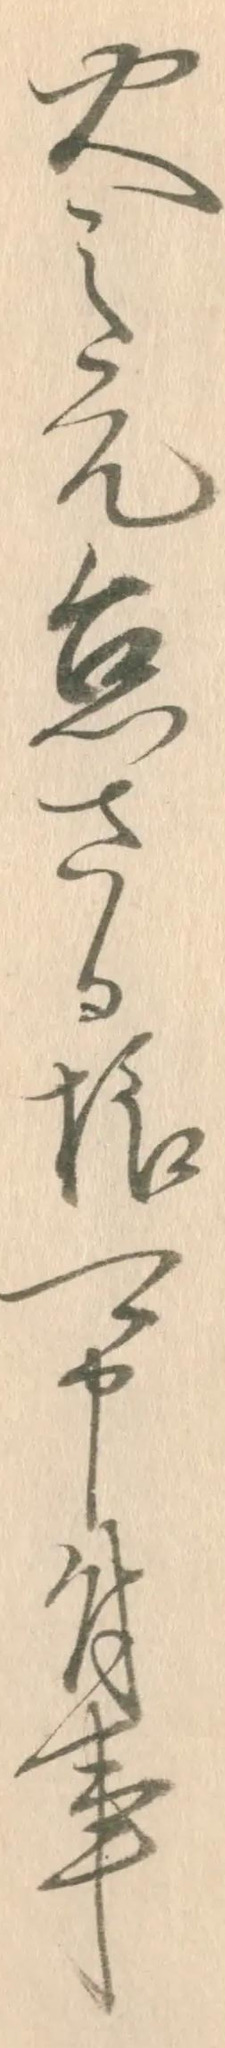火之元怠さる様可申付事
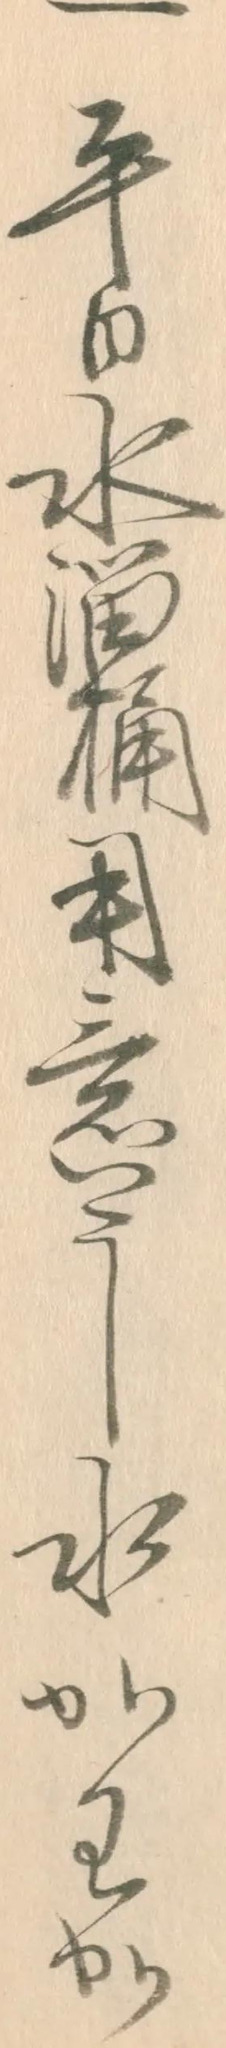一平日水溜桶用意いたし水かわか
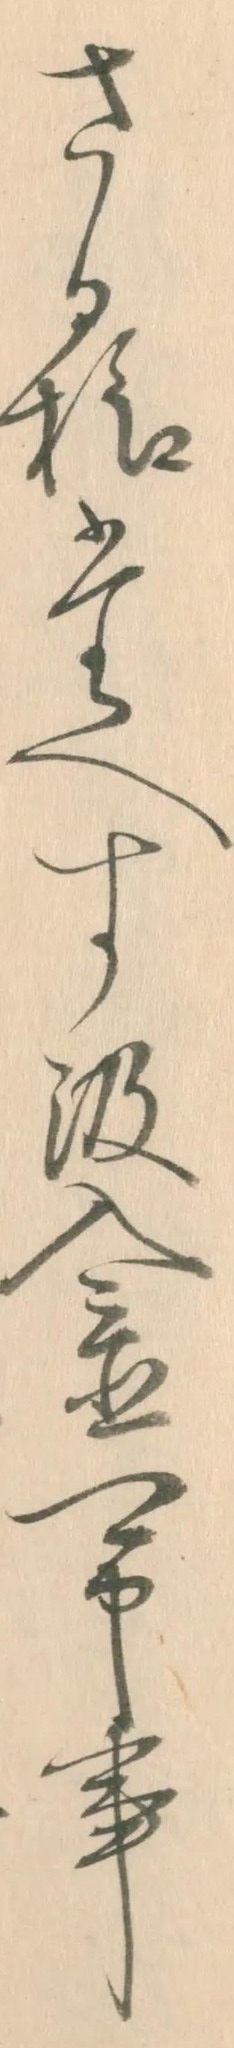さる様たへす汲入置可申事
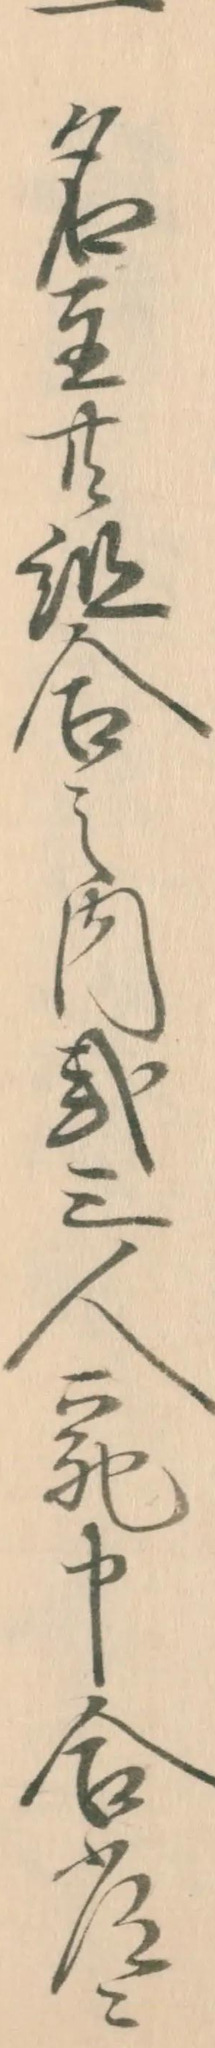一名主共組合之内弐三人宛申合常々
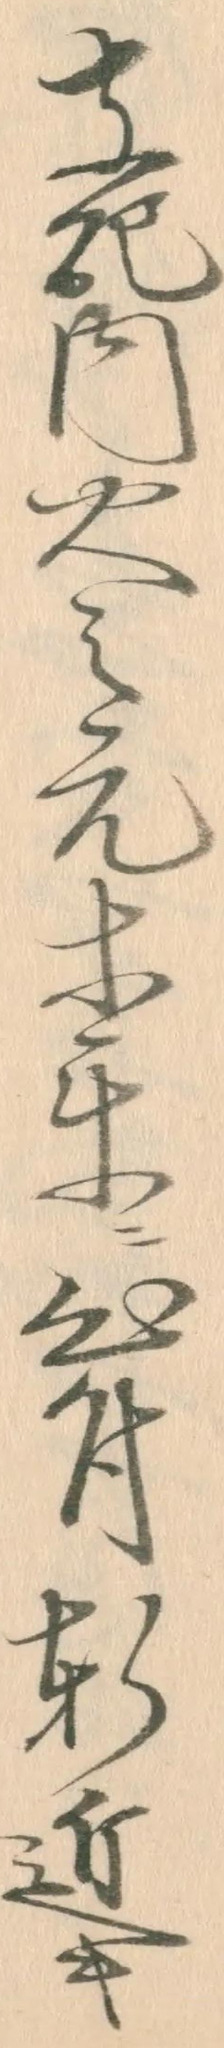支配内火之元等互ニ心付軒近キ
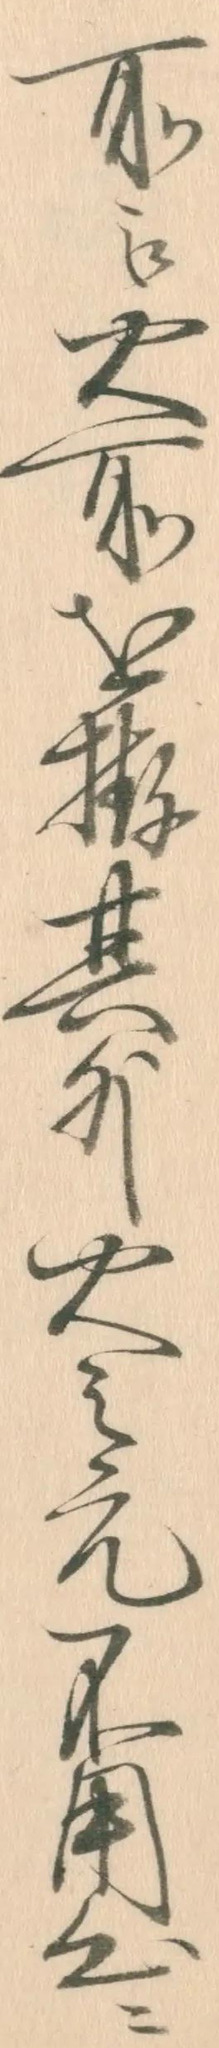所え火所を拵其外火之元不用心ニ
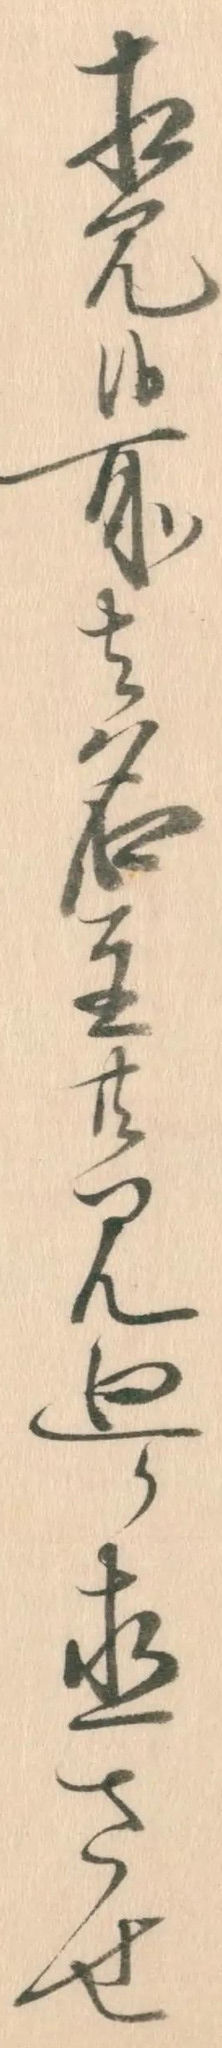相見候所は名主共見廻り直させ
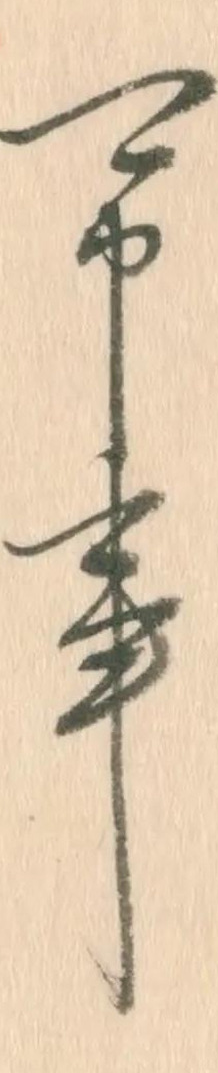可申事

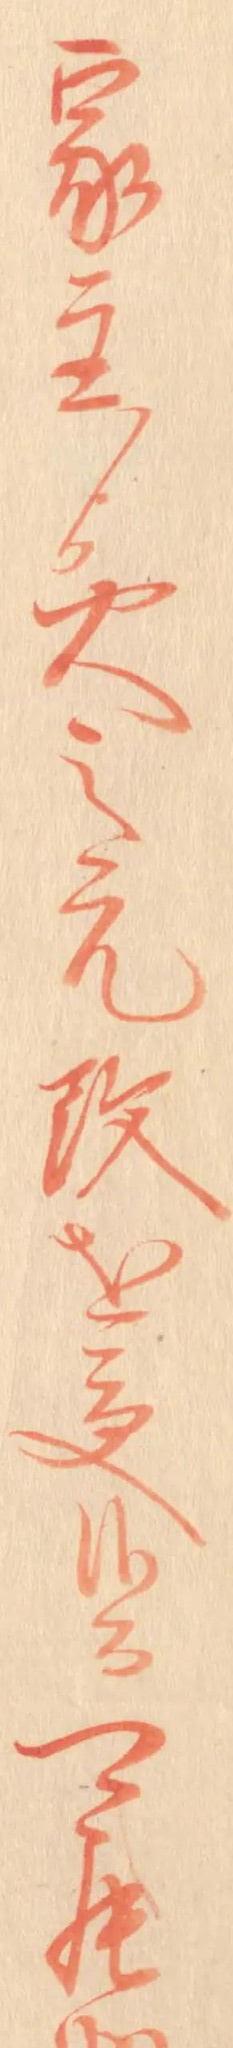家主ゟ火之元改を受候而可罷出候
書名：三橋 17巻. [7] 三橋小破御修復書留　但御奉行御掛リ替地震潰橋番屋　嘉永四亥年より安政二卯年迄　上
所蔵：国立国会図書館 National Diet Library, JAPAN
